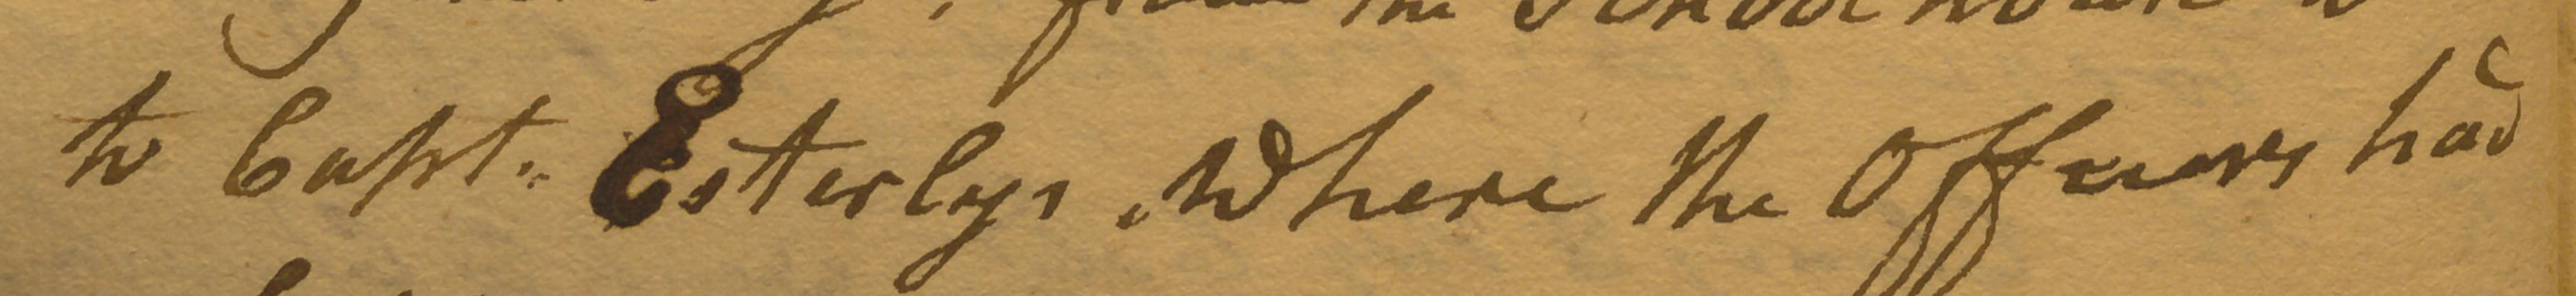to Capt. Esterlys Where the Offccers had
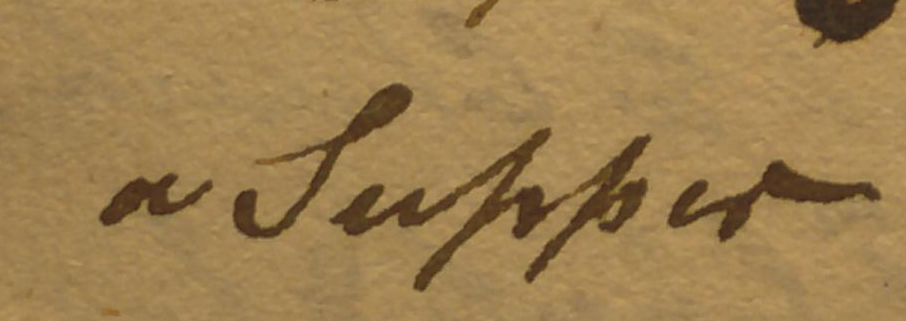a Supper
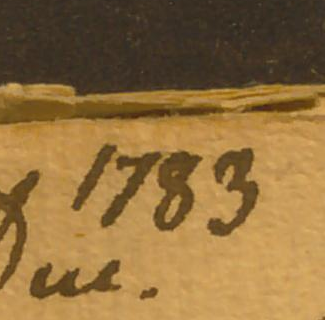1783
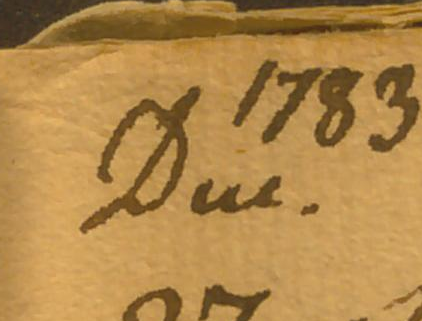Dec.
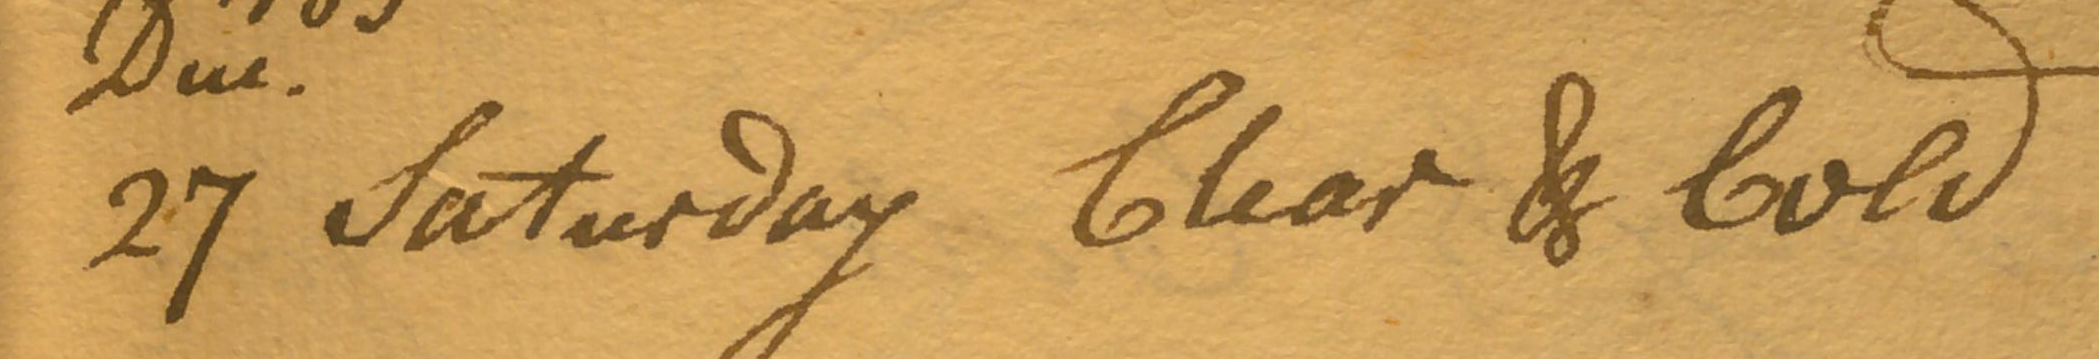27 Saturday Clear & Cold
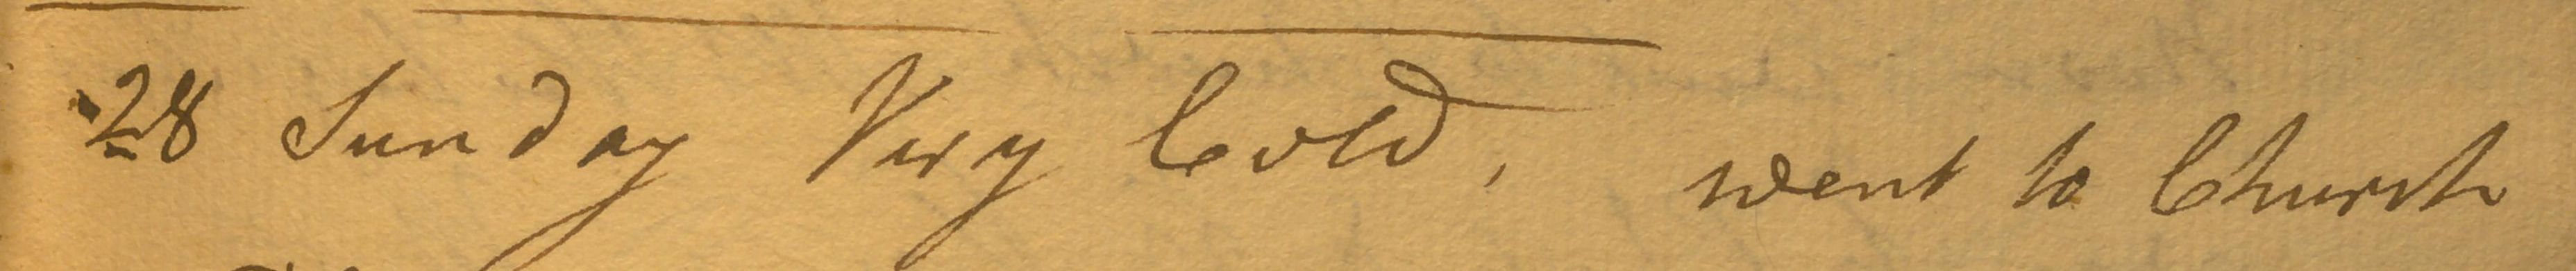28 Sunday Very Cold, went to Church
